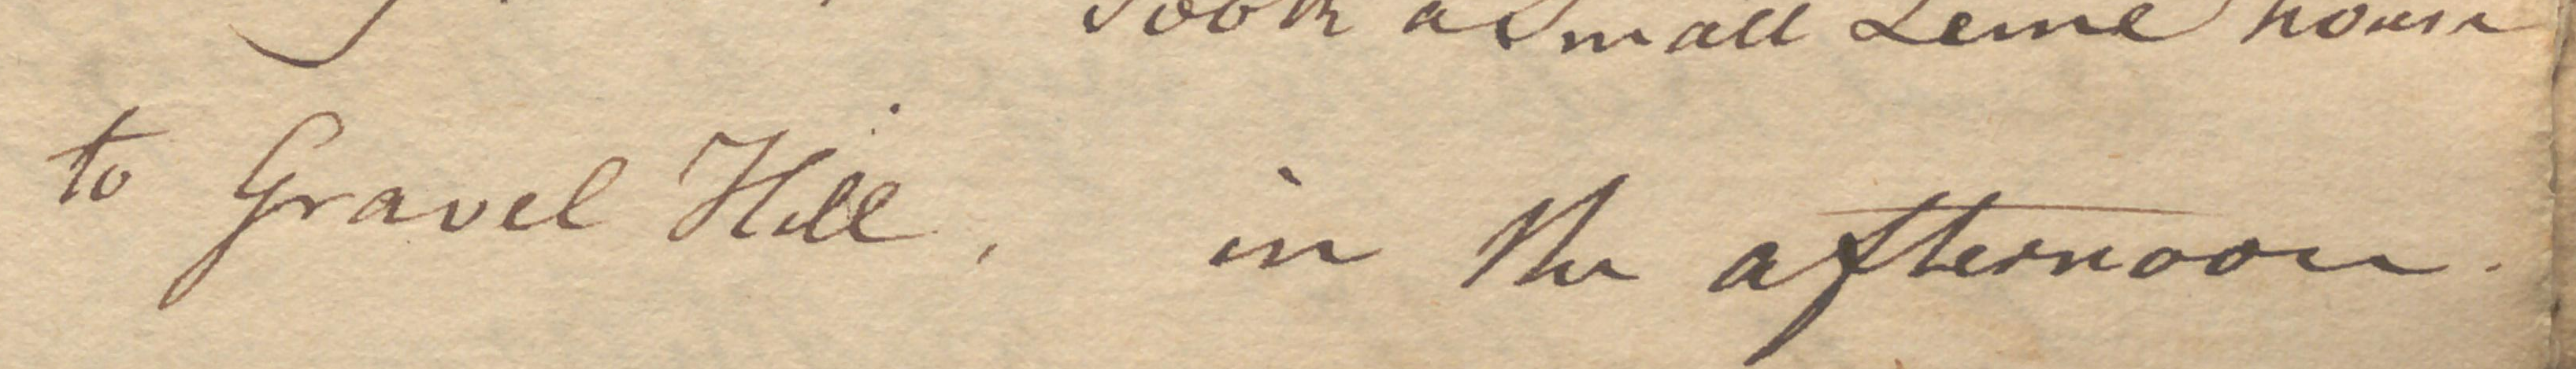to Gravel Hill, in the afternoon.
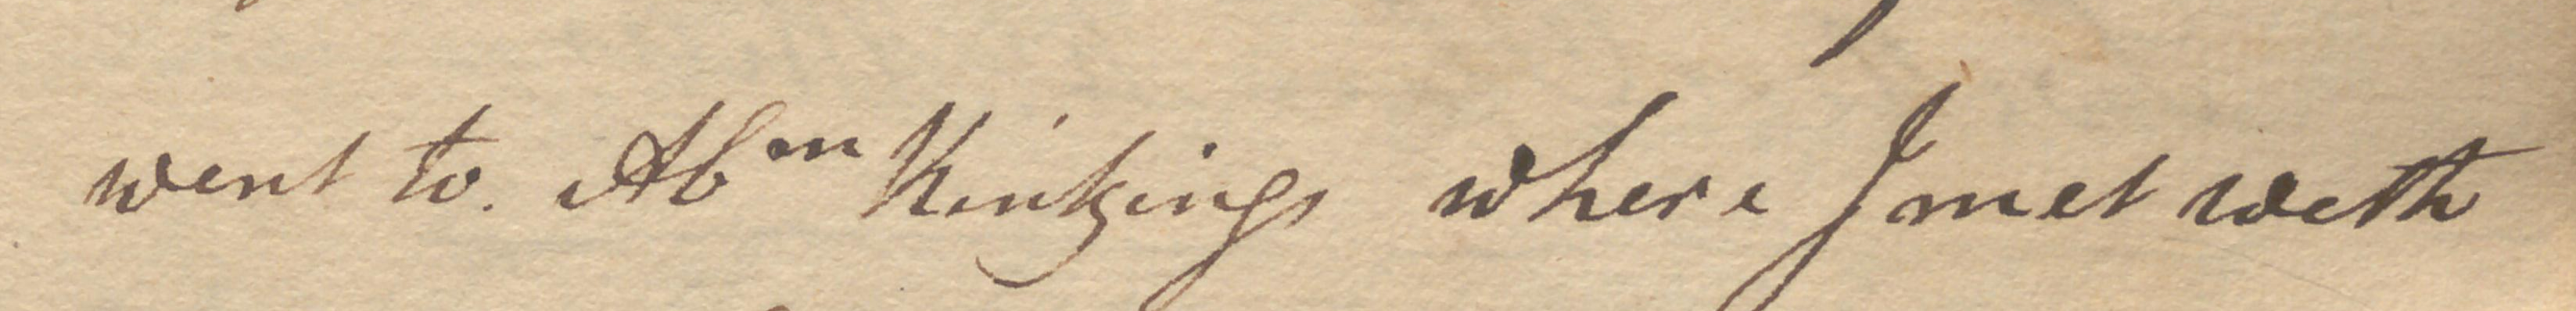went to Ab^m Kintzings where I met with
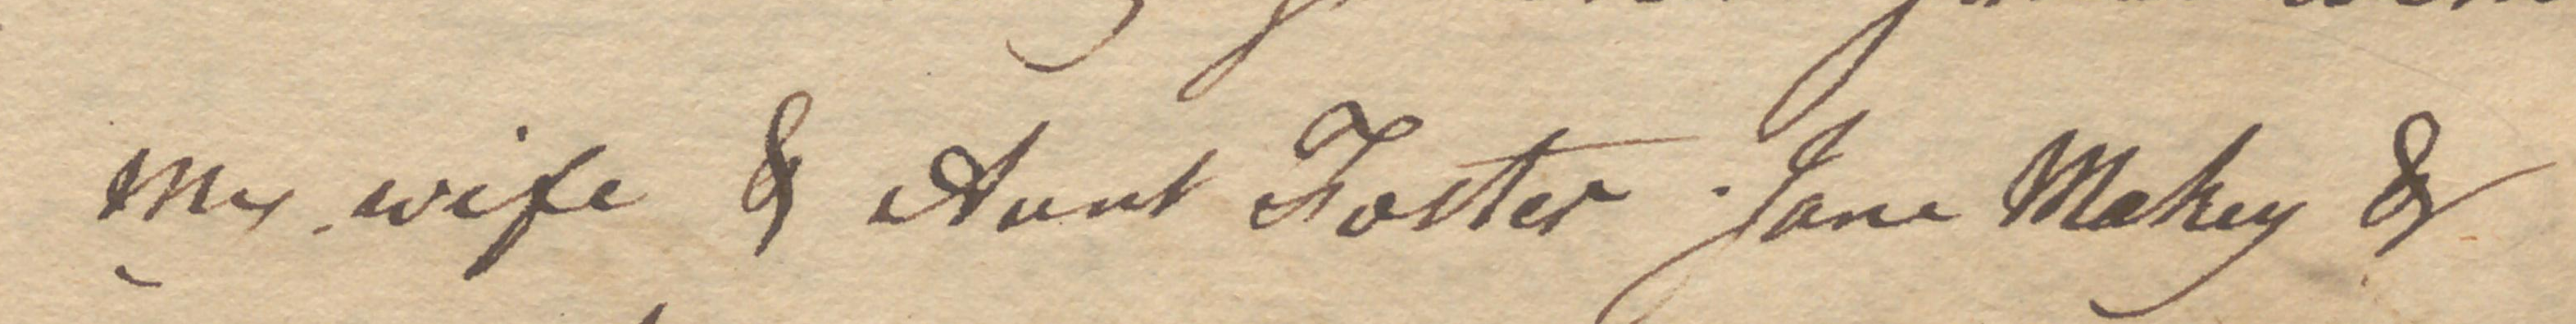My wife & Aunt Foster Jane Makey &
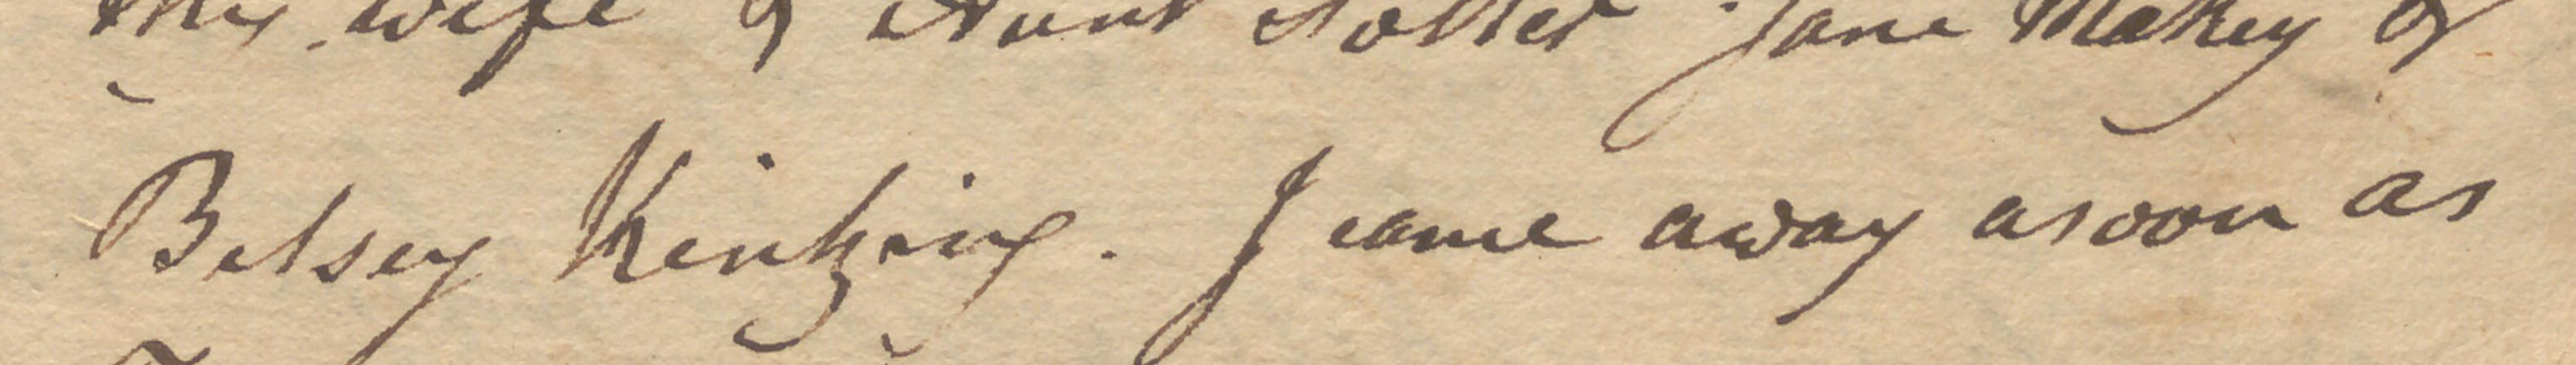Betsey Kintzing. I came away a soon as
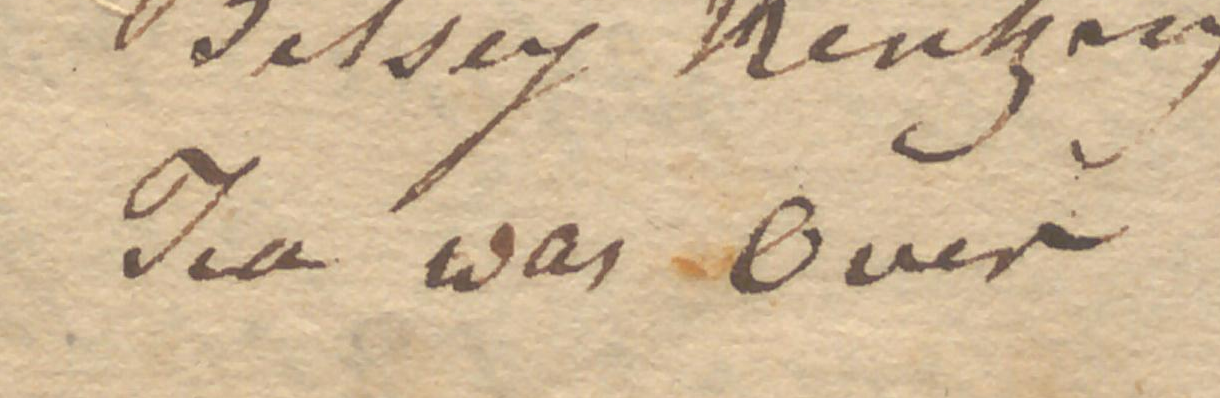Tea was over
